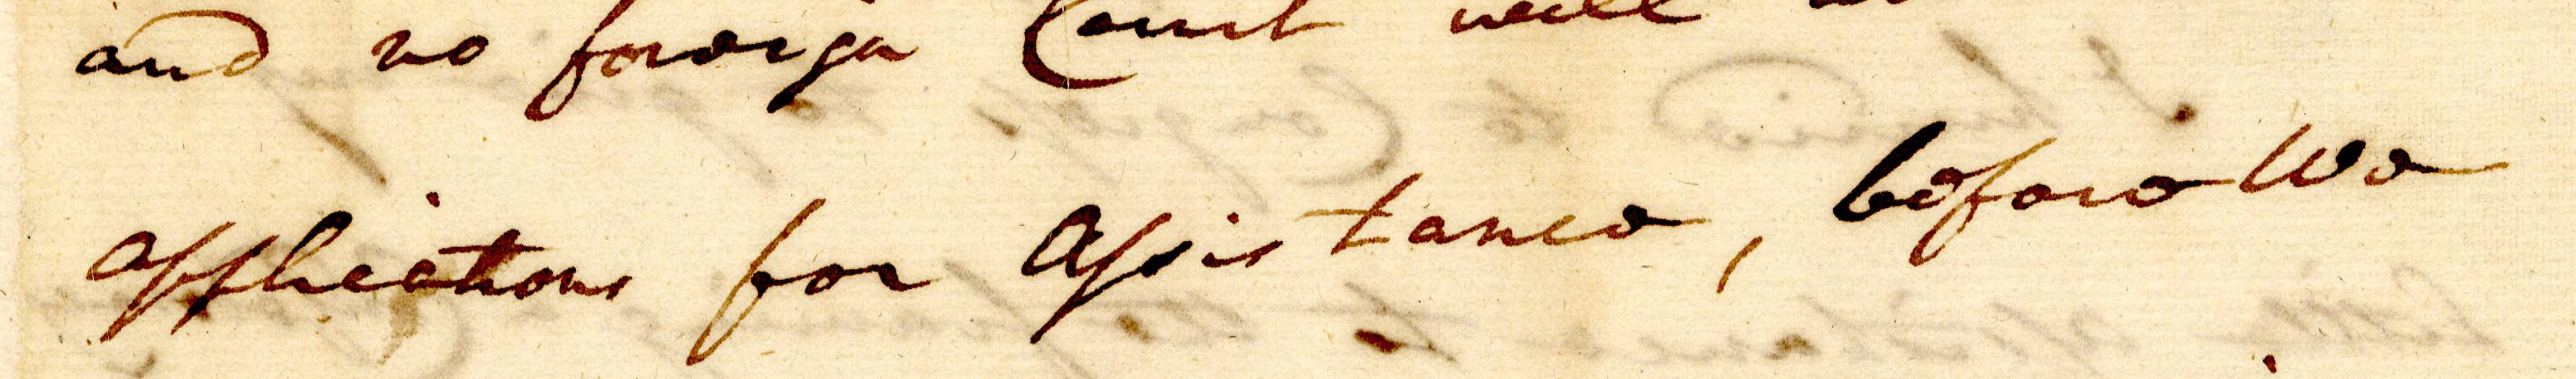applications for Assistance before We
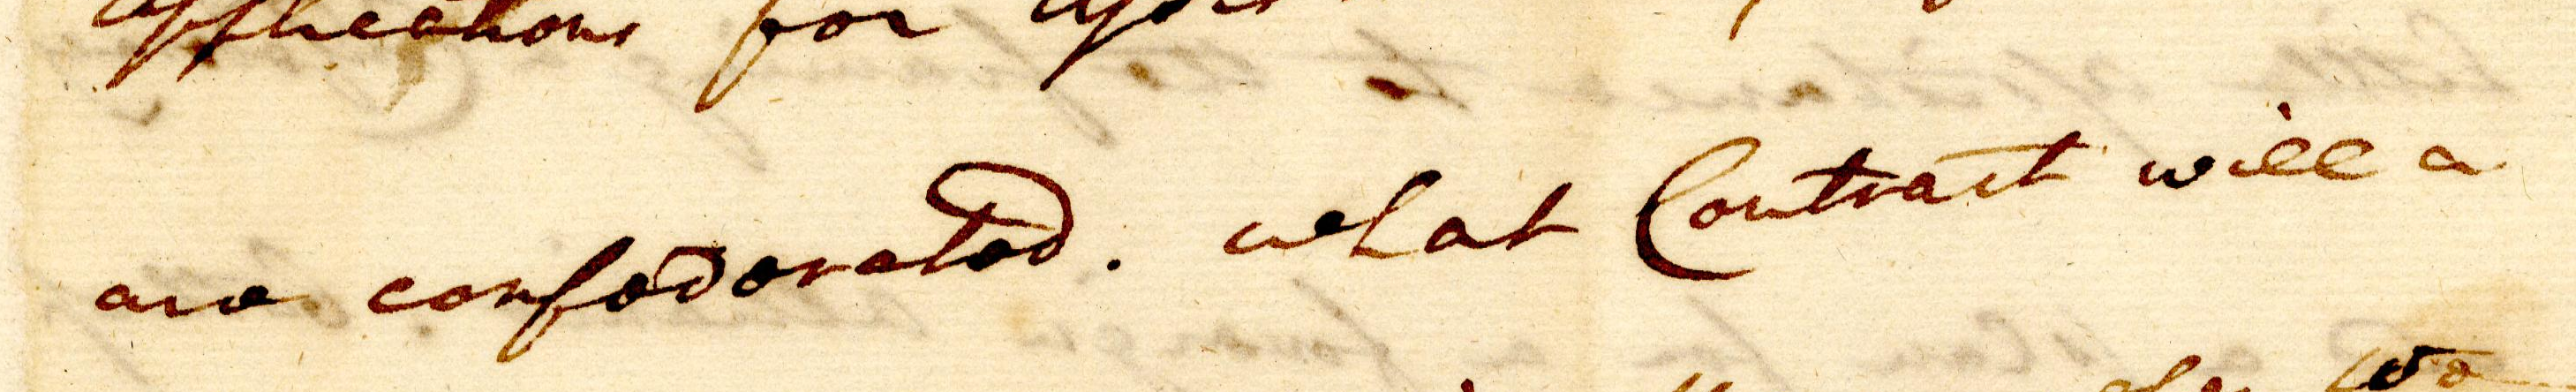are confederated, what Contract will a
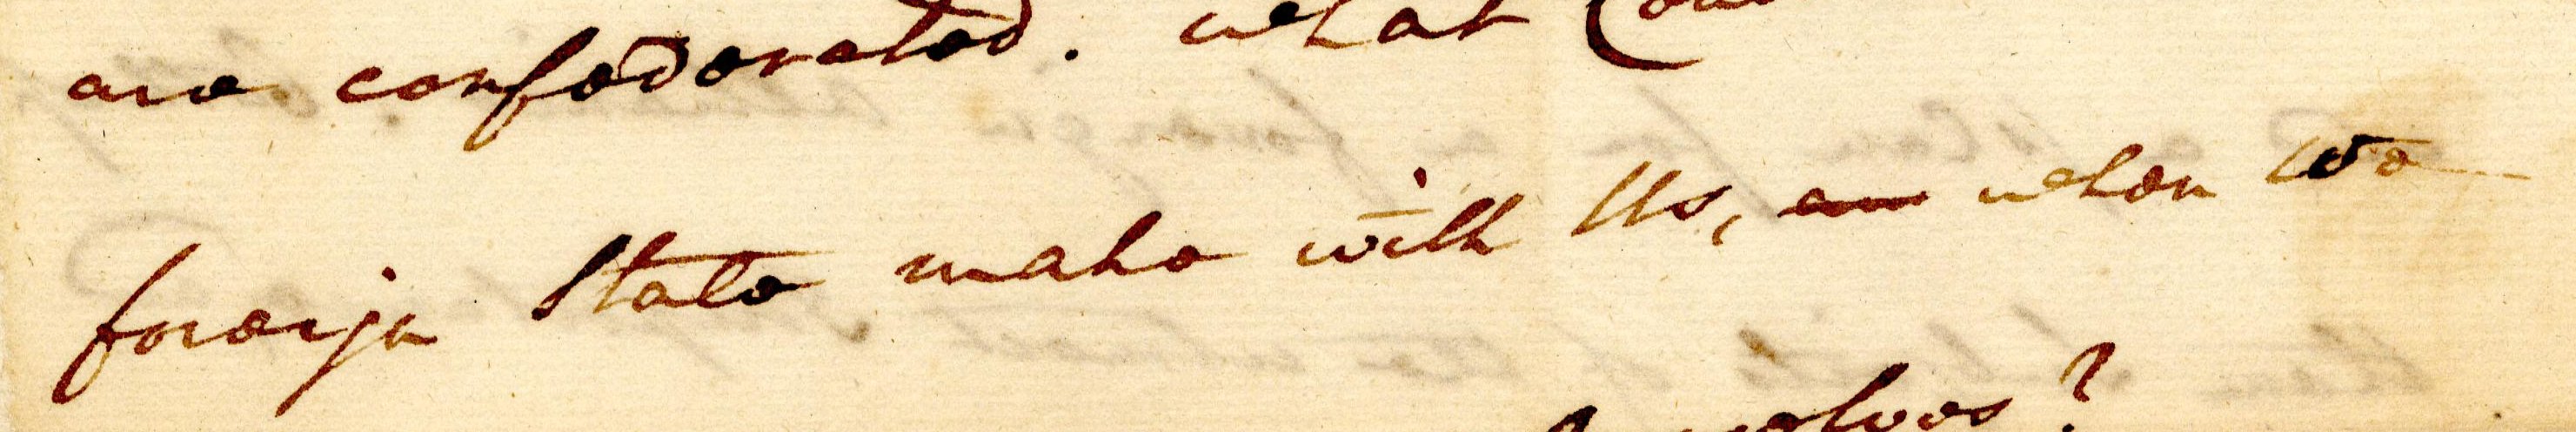foreign state make with With us [__] when we
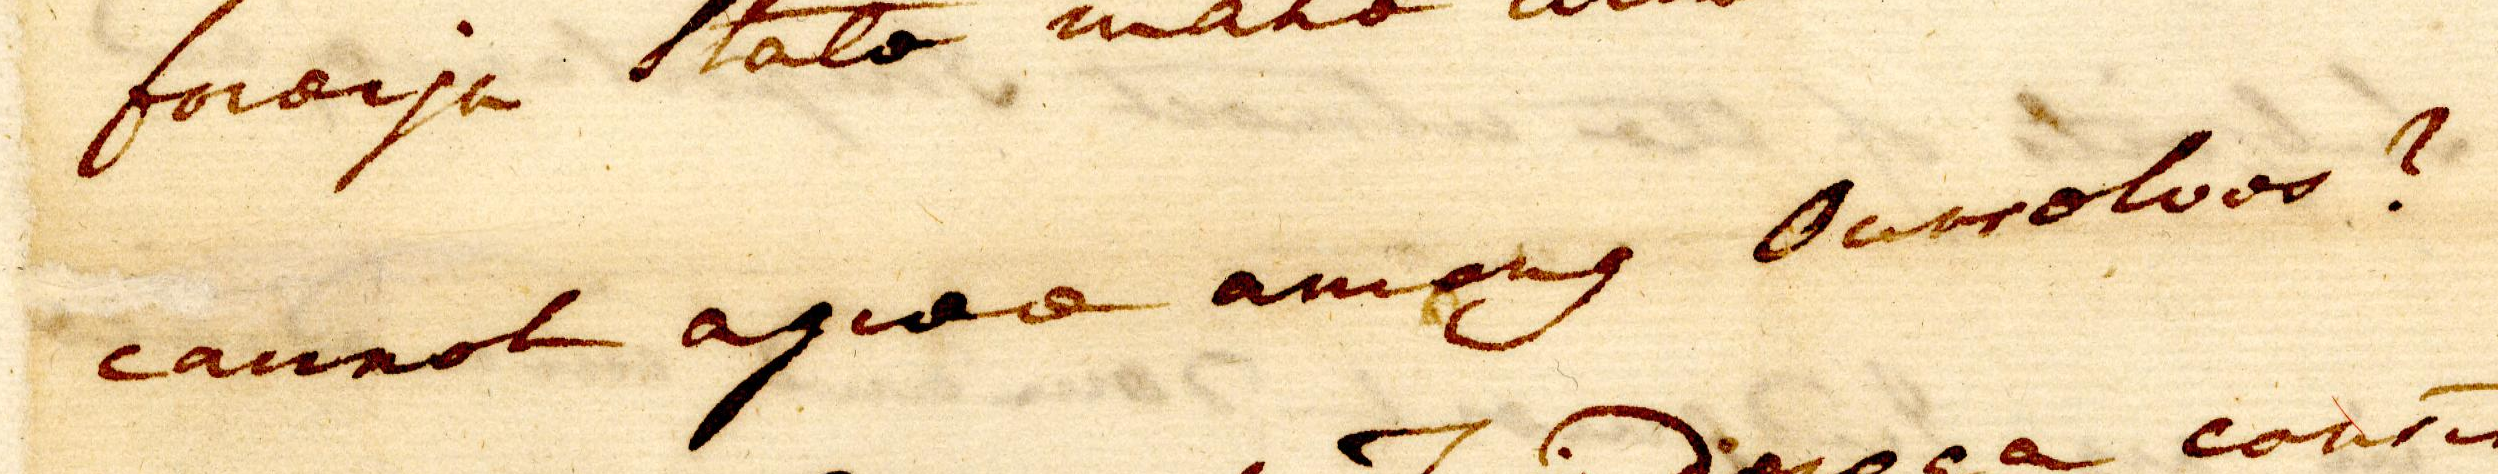cannot agree among Ourselves?
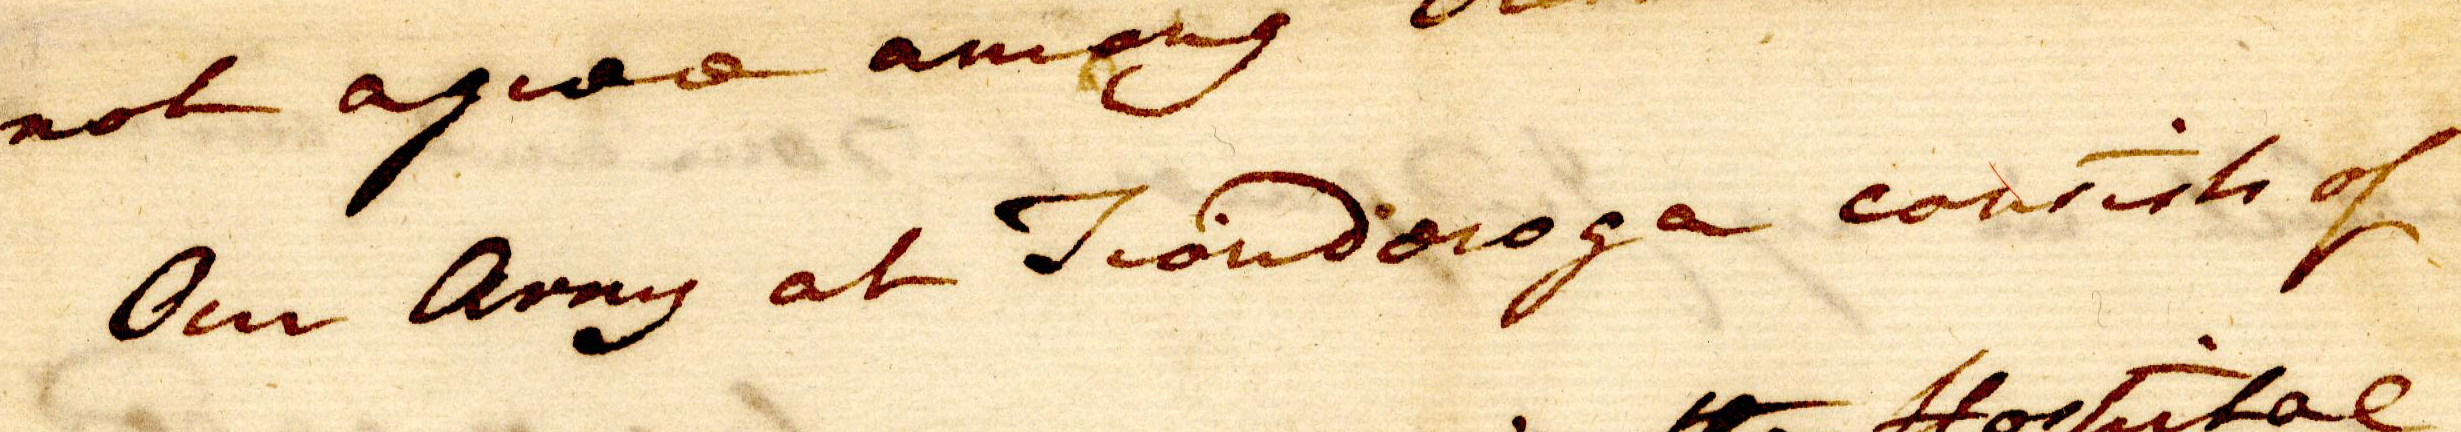Our Army at Ticonderoga consists of
